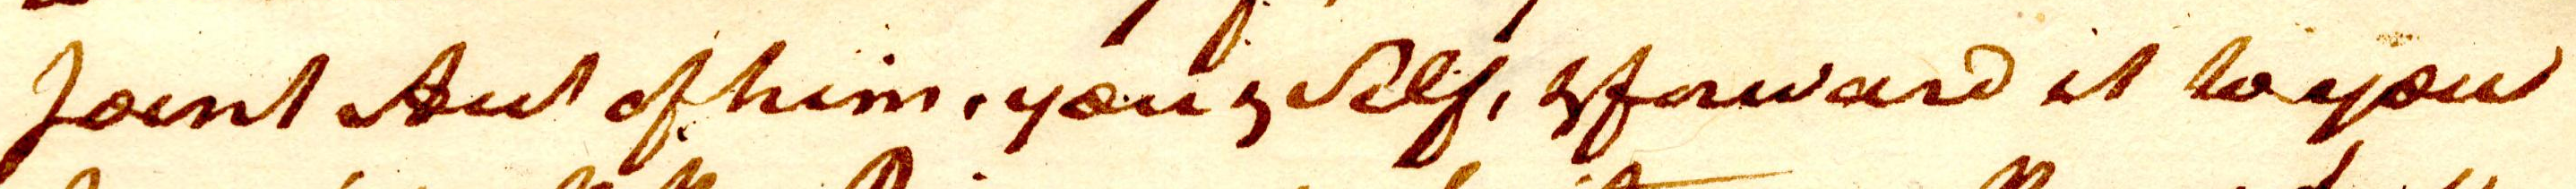Joint Acc^t of him, yourself, & forward it to you
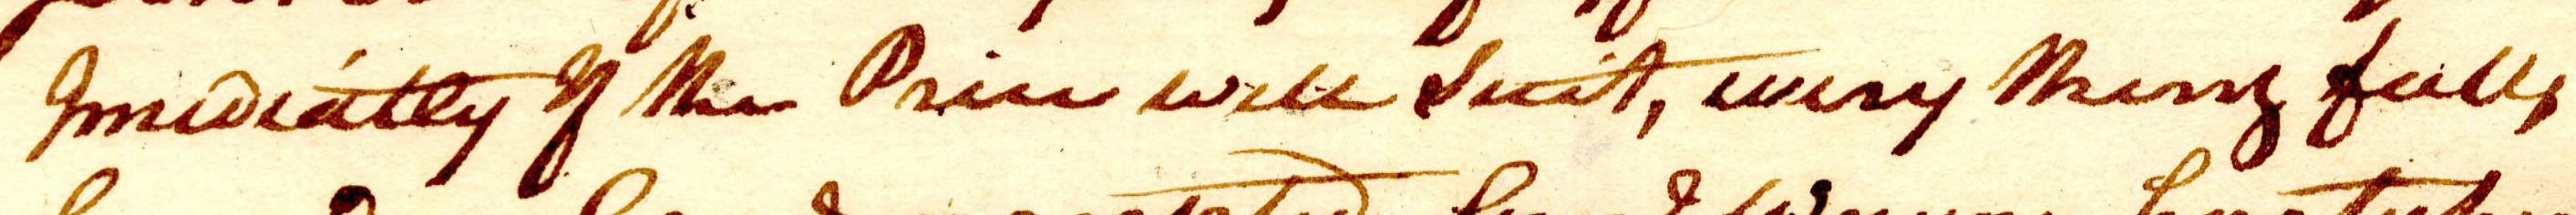Imidiatly If the Price will suit, every thing falls
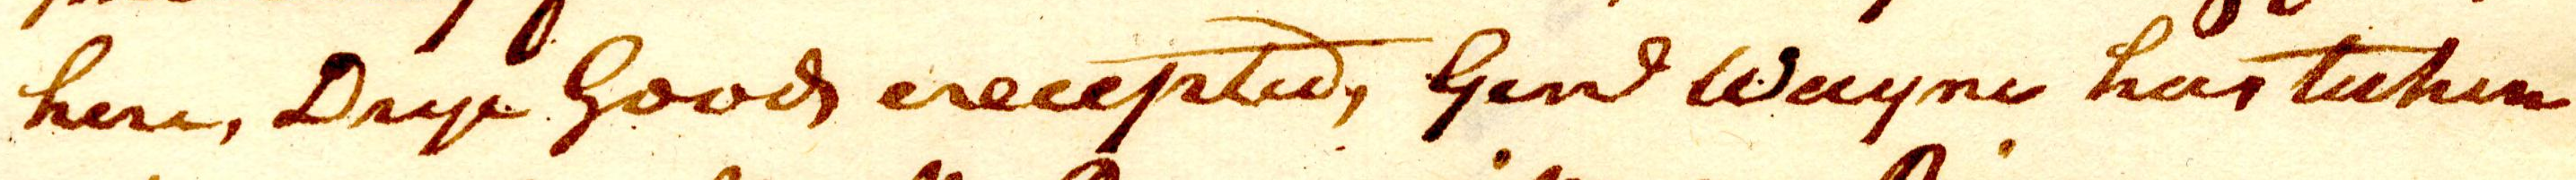here, Drye Goods excepted, Gen^l Wayne has taken
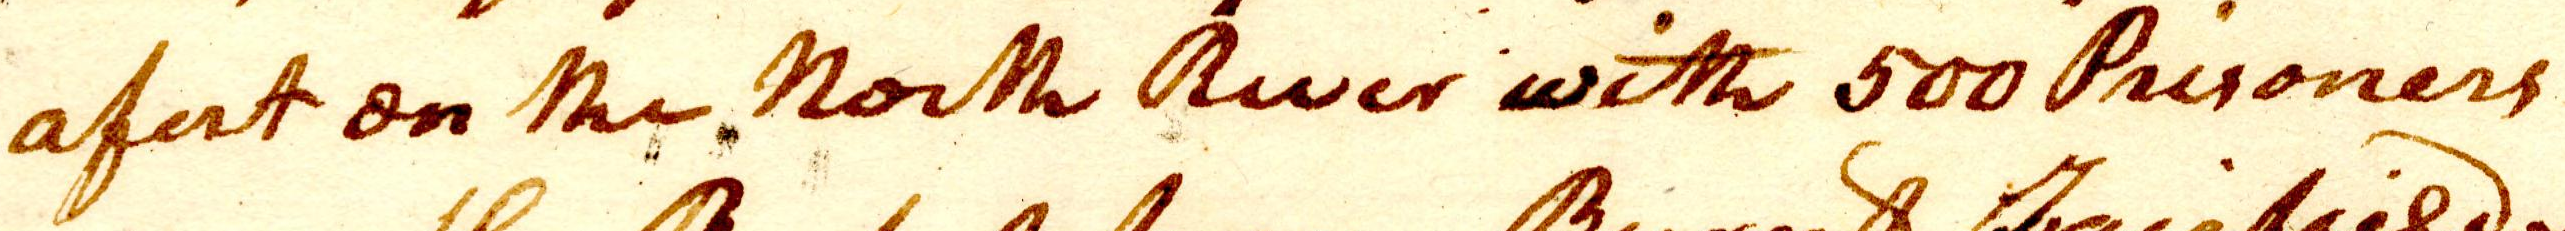a fort on the North River with 500 Prisoners
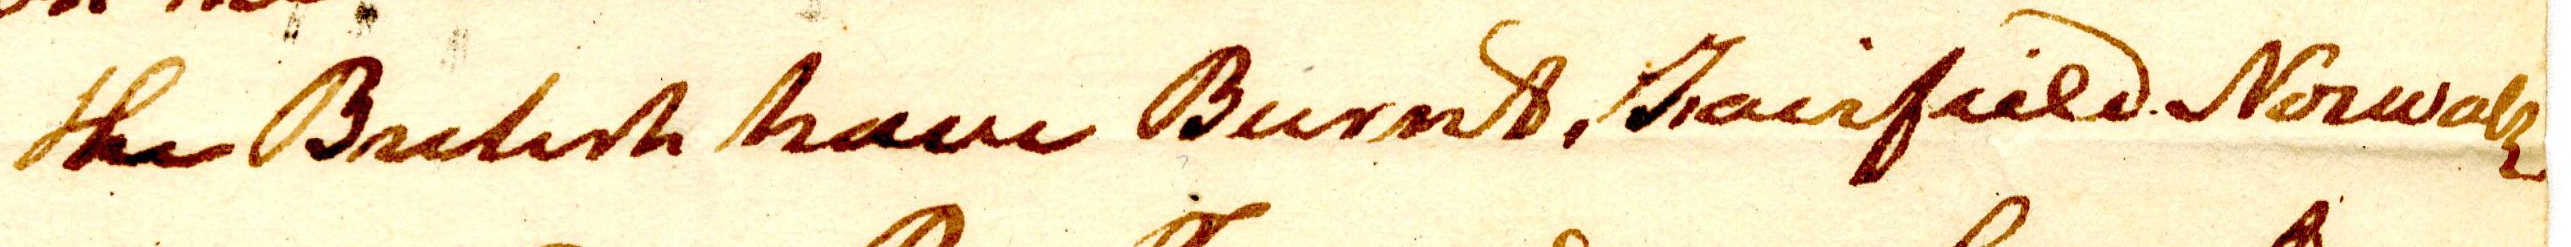the British have Burnt Fairfield Norwalk
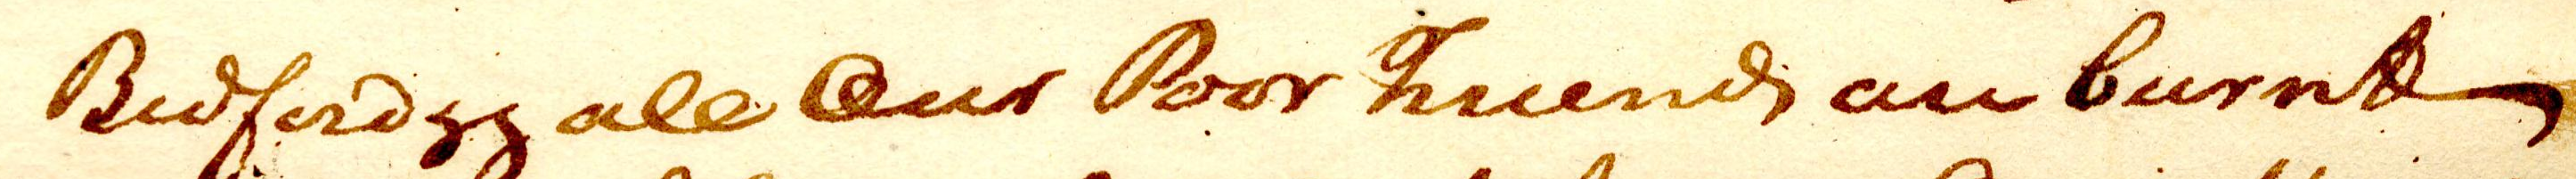Bedfords all our Poor friends are burnt
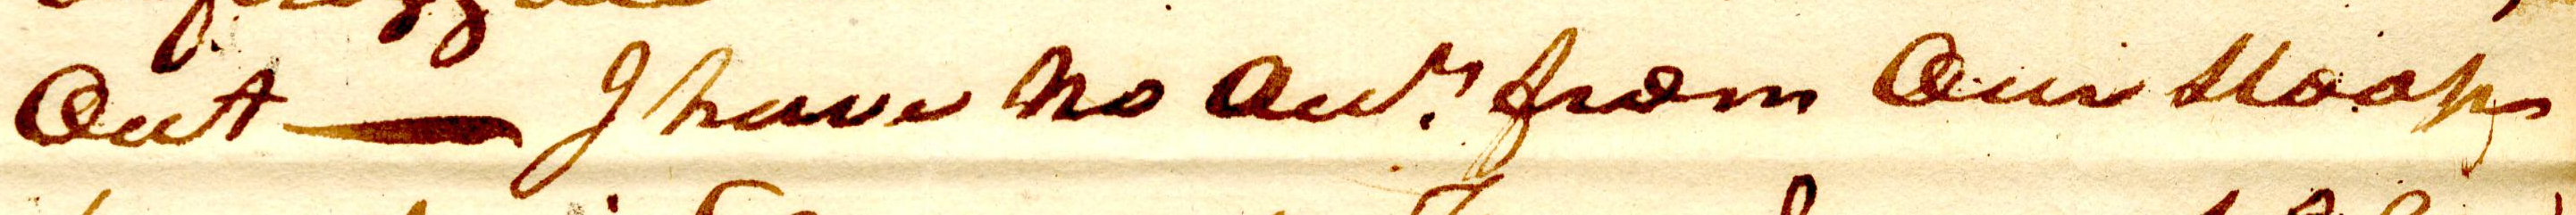Out- I have no Acc^t from our sloop
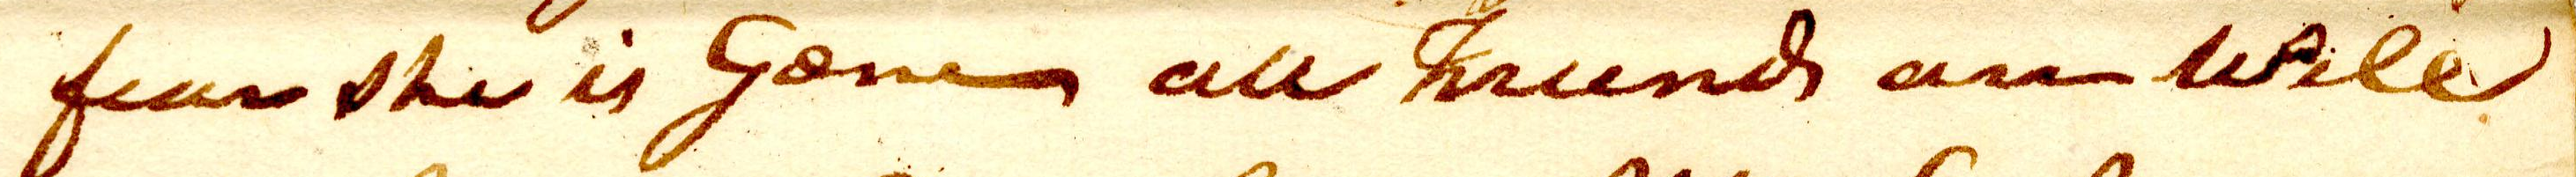fear she is Gone, all Friends an will
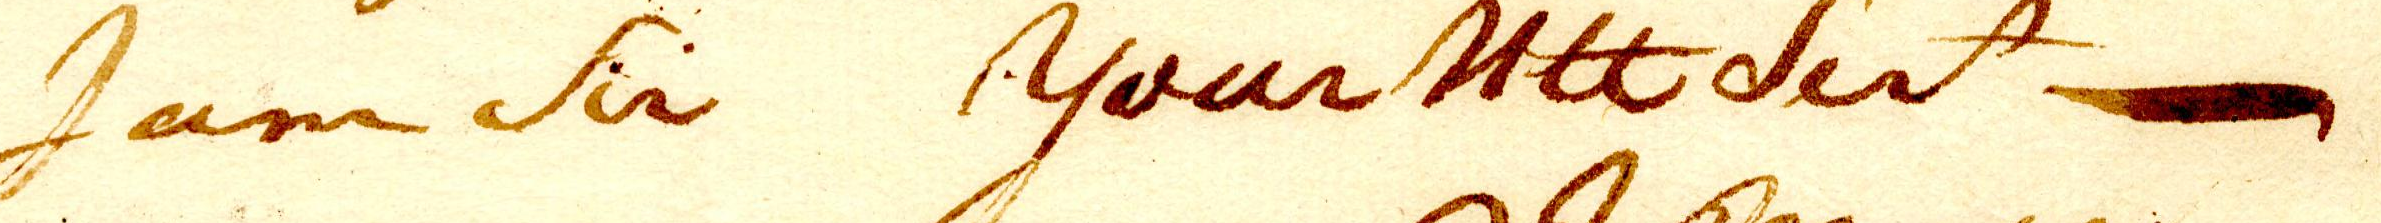I am Sir your Hbl ser^t
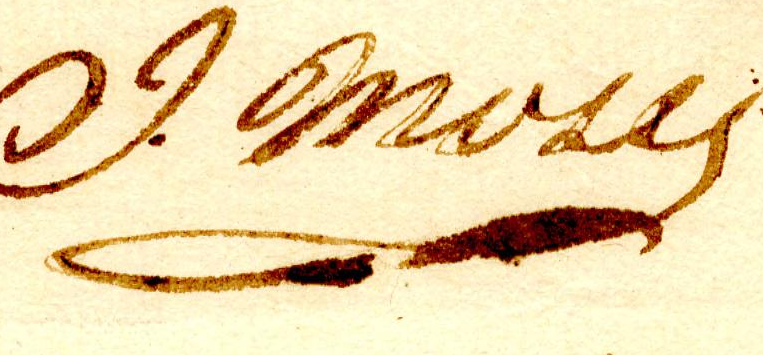I. Moses
